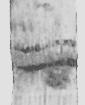二
